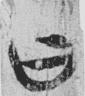曰
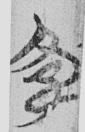韋（回）
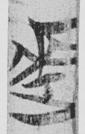○（來）
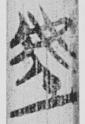○（吾）
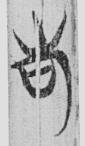告
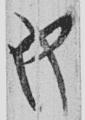女（汝）
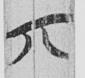亓（其）
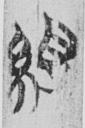{組又}（組）
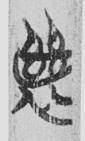○（絕）
